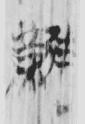難
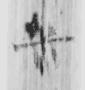必
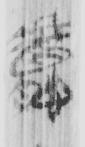慮
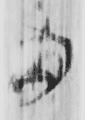{止舟}
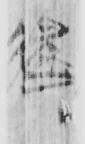退
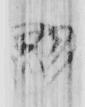則
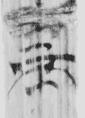不
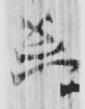至
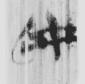母
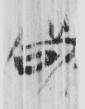咸
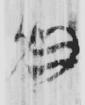於
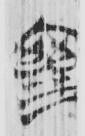{宀臸}
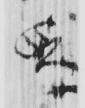色
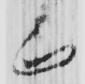㠯（以）
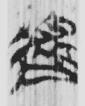還
